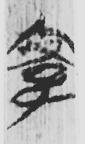{宀韋}
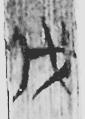伐
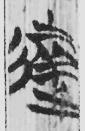{辶止㚔}（失）
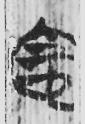{宀𠁩}（仲）
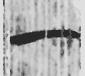一
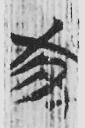豕
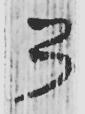乃
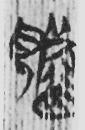{睿見}
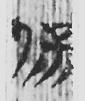保
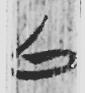㠯（以）
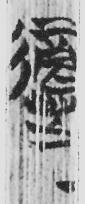{辶辛𠂤臼}
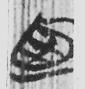廼
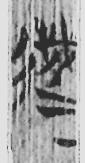{辶戔}
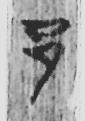邑
